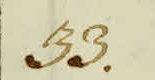33.
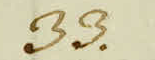33.
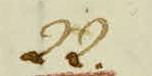22.
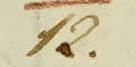12.
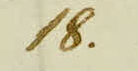18.
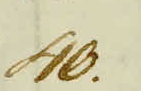40.
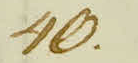40.
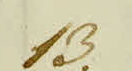13.
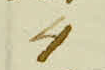4
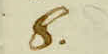8.
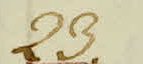23.
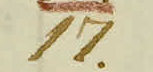17.
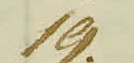19.
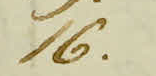16.
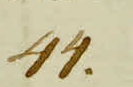44.
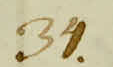34.
